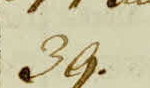39.
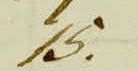15.
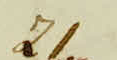21.
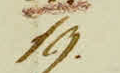19.
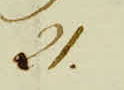21.
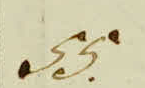55.
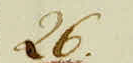26.
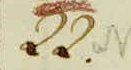22.
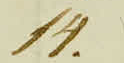14.
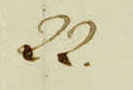22.
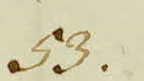53.
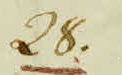28.
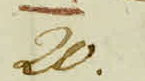20.
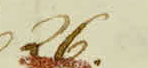26.
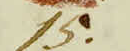15.
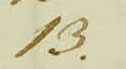13.
